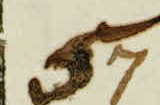57
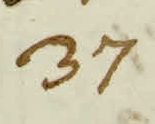37
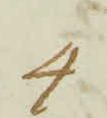4
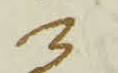3
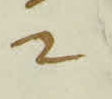2
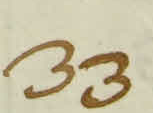33
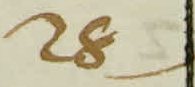28
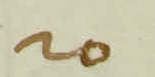20
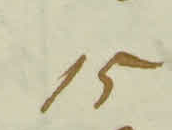15
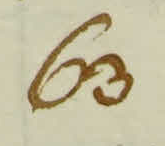63
